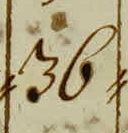36
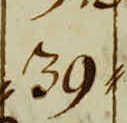39
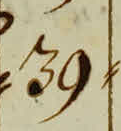39
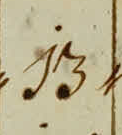13
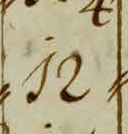12
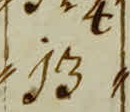13
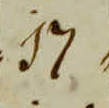17
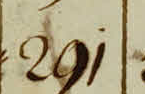291
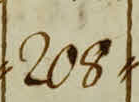208
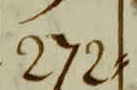272
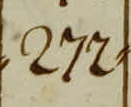272
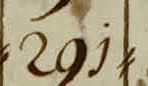291
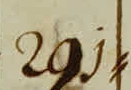291
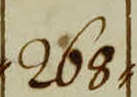268
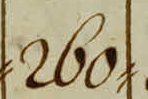260
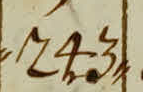243
